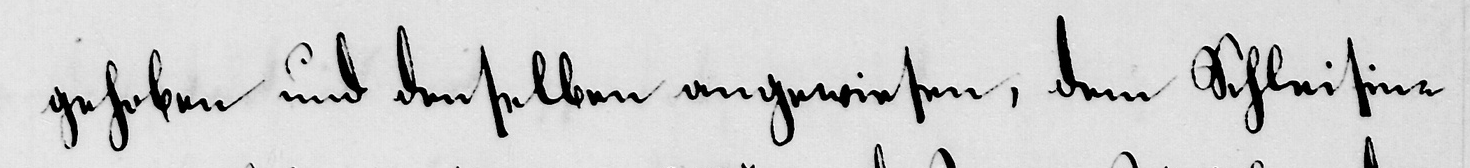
gehoben und denselben angewiesen, dem Schleisin¬
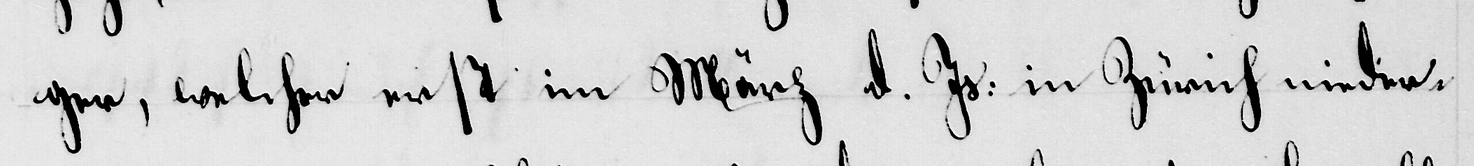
ger, welcher erst im März d. Js. in Zürich nieder¬
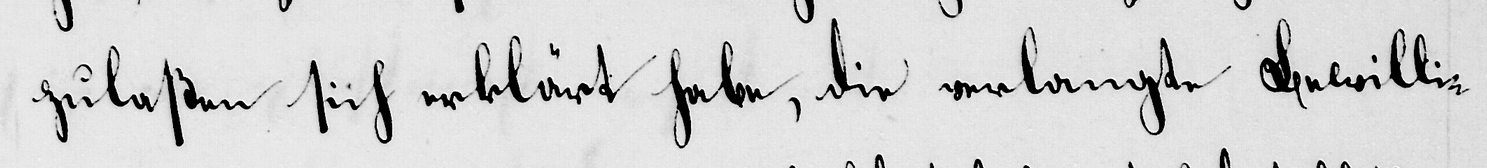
zulaßen sich erklärt habe, die verlangte Bewilli¬
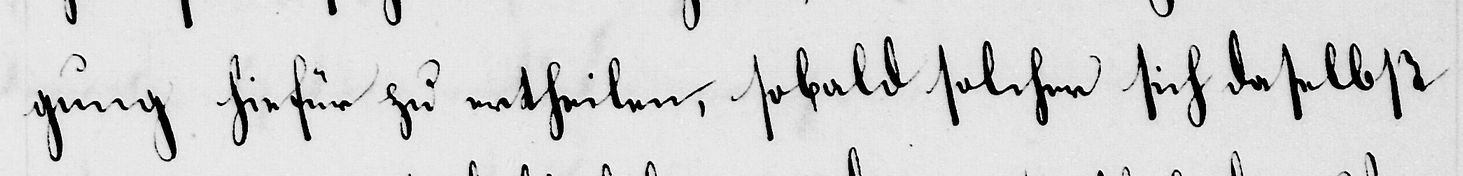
gung hiefür zu ertheilen, sobald solcher sich daselbst
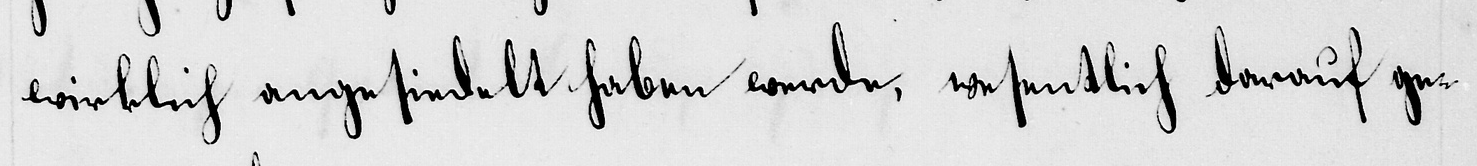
wirklich angesiedelt haben werde, wesentlich darauf ge¬
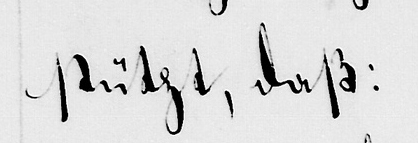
stützt, daß:
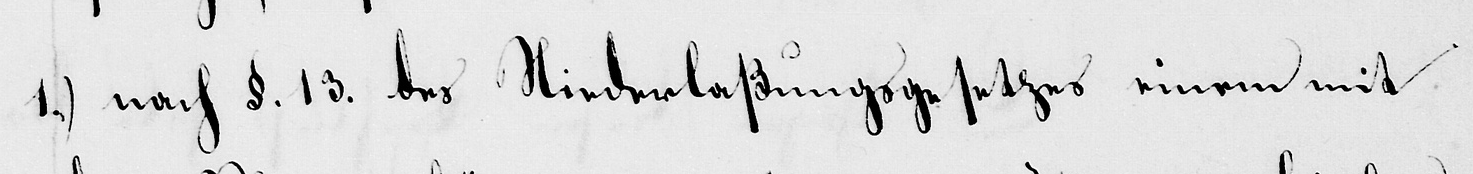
1.) nach §. 13. des Niederlaßungsgesetzes einem mit
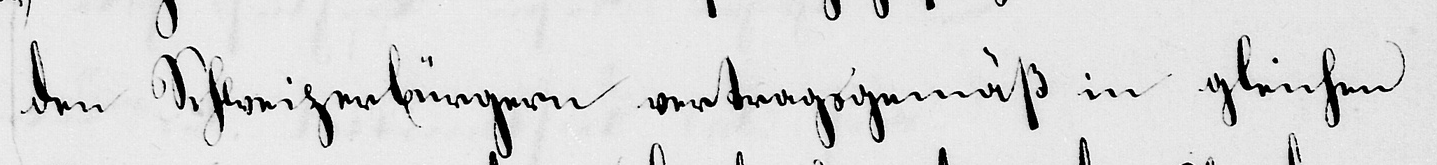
den Schweizerbürgern vertragsgemäß in gleichen
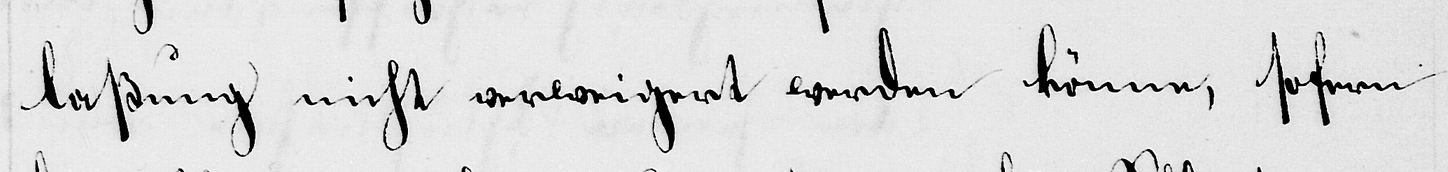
laßung nicht verweigert werden könne, sofern
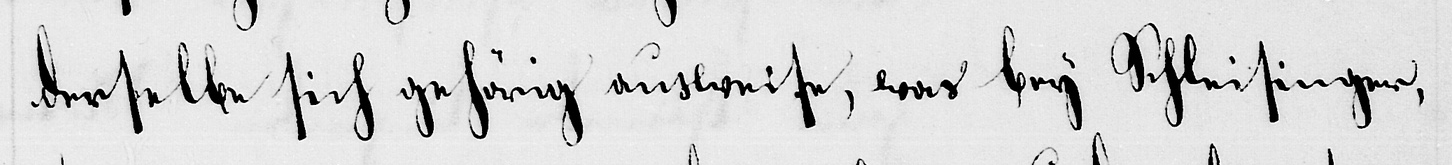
derselbe sich gehörig ausweise, was bey Schleisinger,
